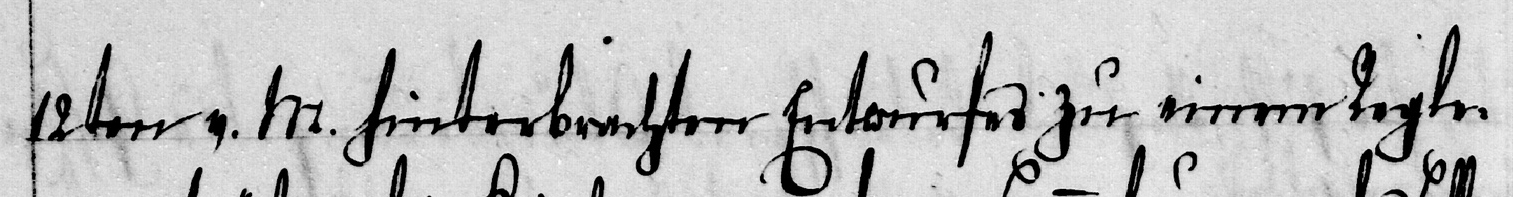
12ten v. M. hinterbrachten Entwurfes zu einem Regle¬
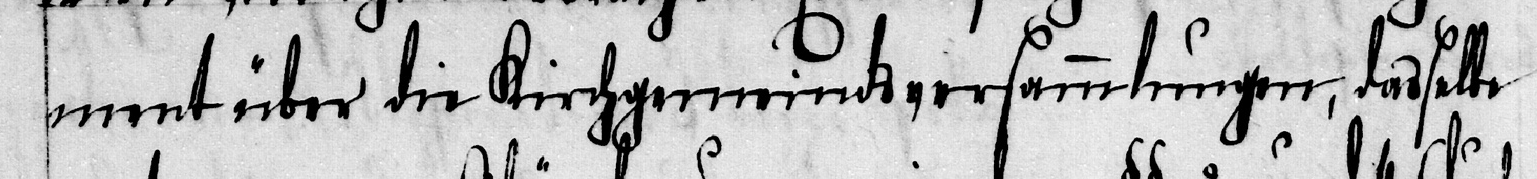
ment über die Kirchgemeindsversammlungen, dasselbe
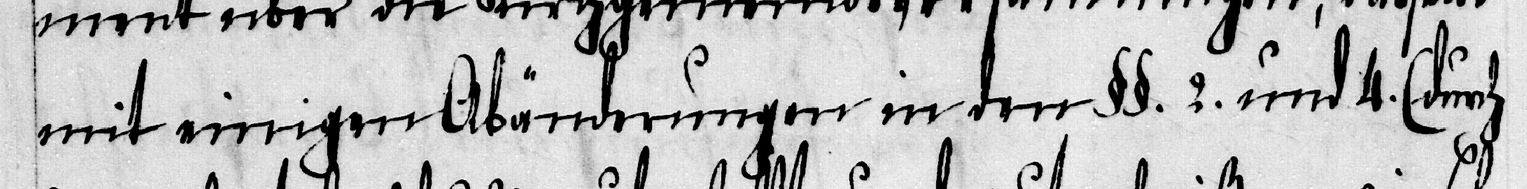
mit einigen Abänderungen in den §§. 2. und 4. (durch
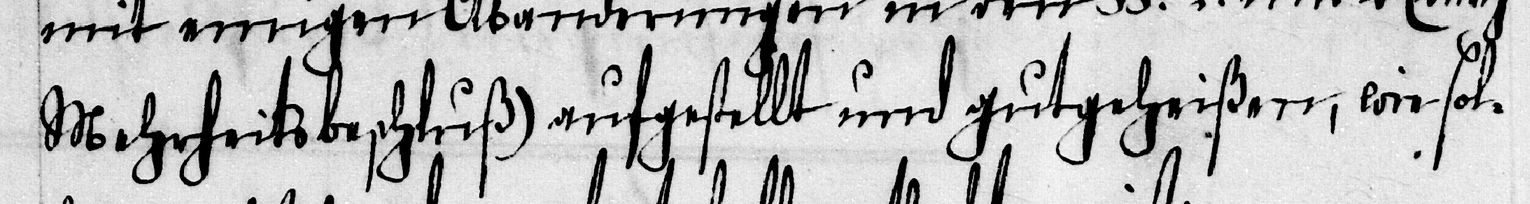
Mehrheitsbeschluß) aufgestellt und gutgeheißen, wie sol¬
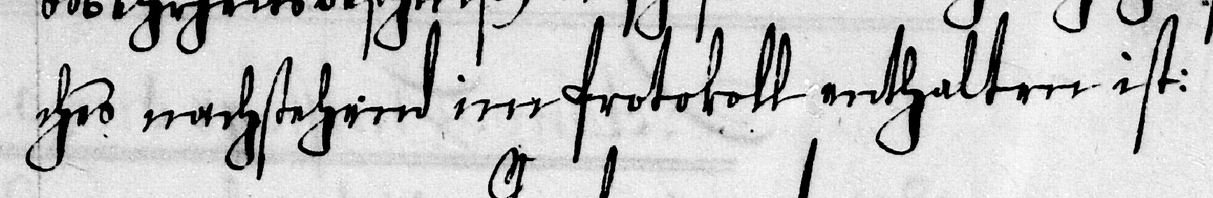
ches nachstehend im Protokoll enthalten ist:
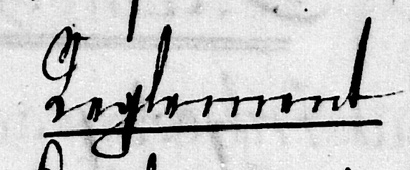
Reglement
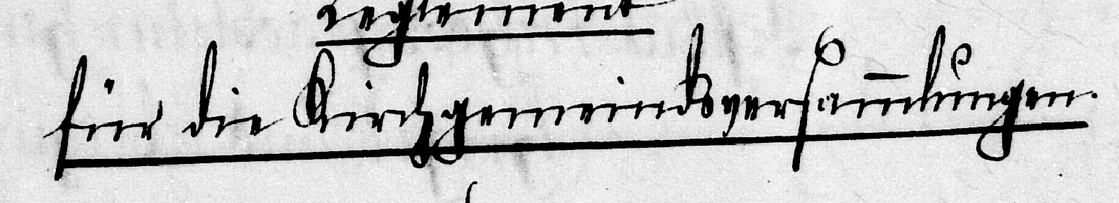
für die Kirchgemeindsversammlungen.
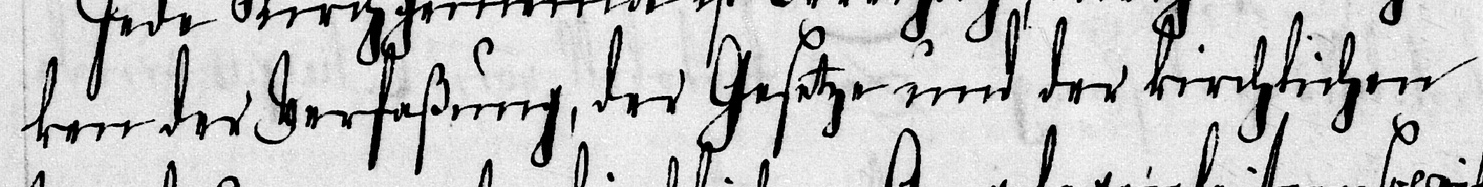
ken der Verfaßung, der Gesetze und der kirchlichen
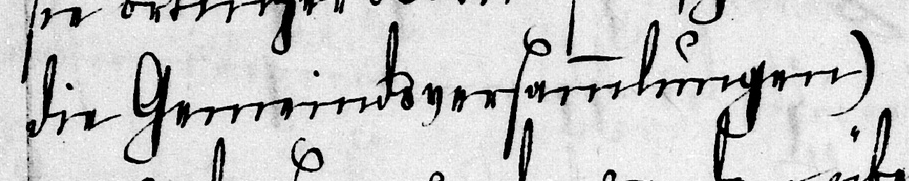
die Gemeindsversammlungen)
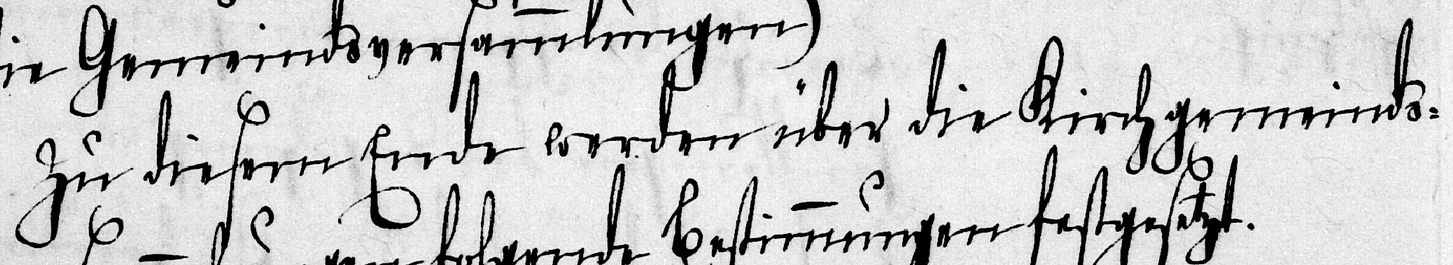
Zu diesem Ende werden über die Kirchgemeinds¬
